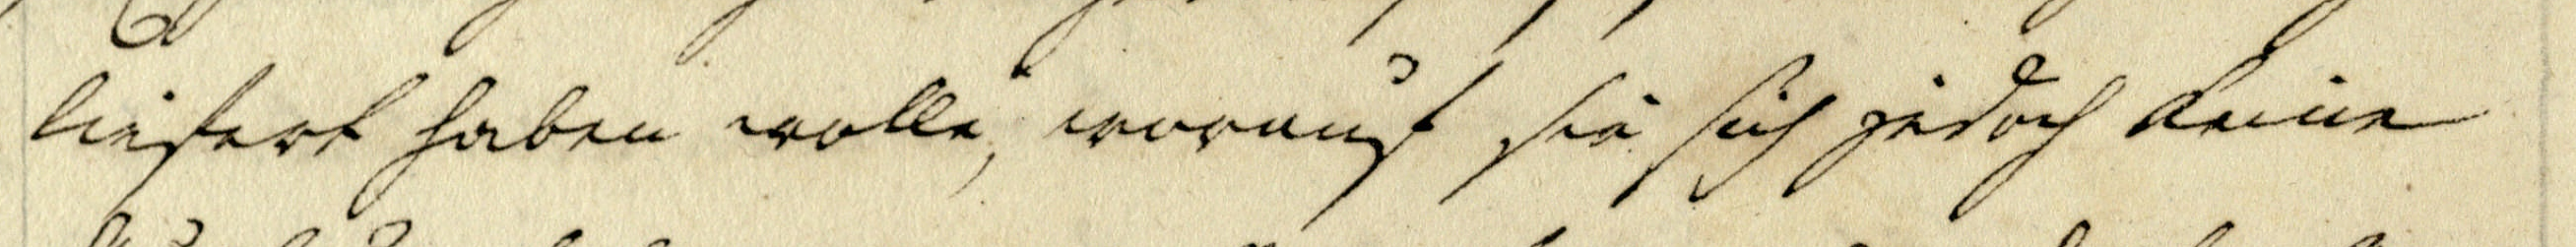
liefert haben wolle, worauf sie sich jedoch keine
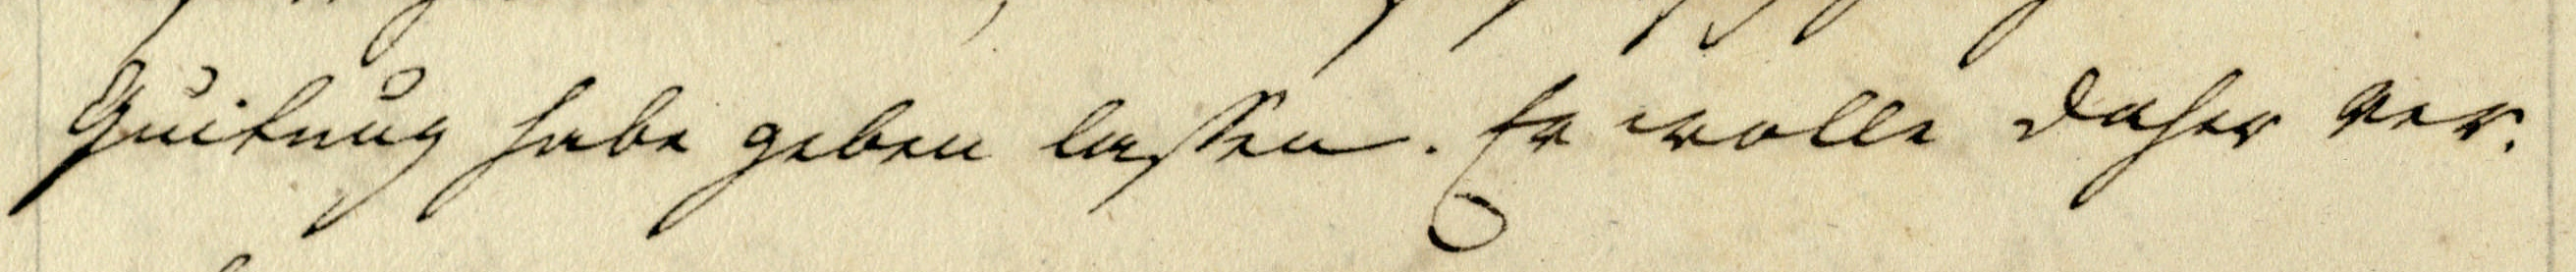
Quitung habe geben lassen. Er wolle daher ver¬
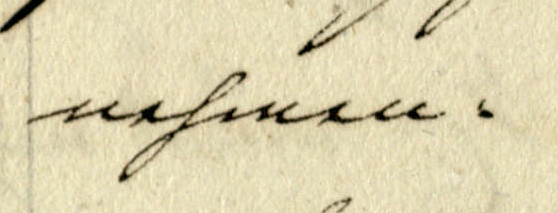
nehmen:
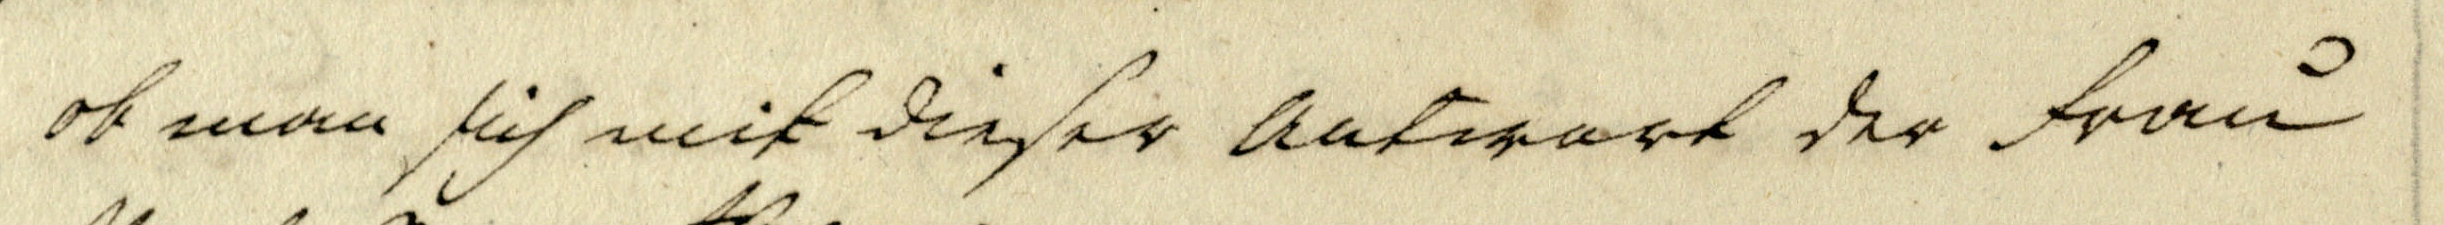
ob man sich mit dieser Antwort der Frau
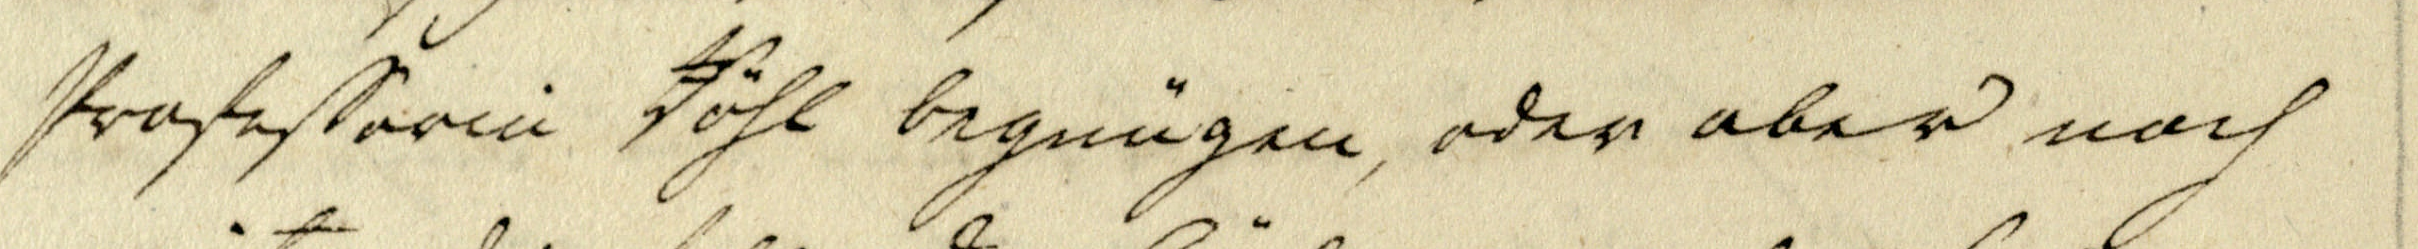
Professorin Röhl begnügen, oder aber noch
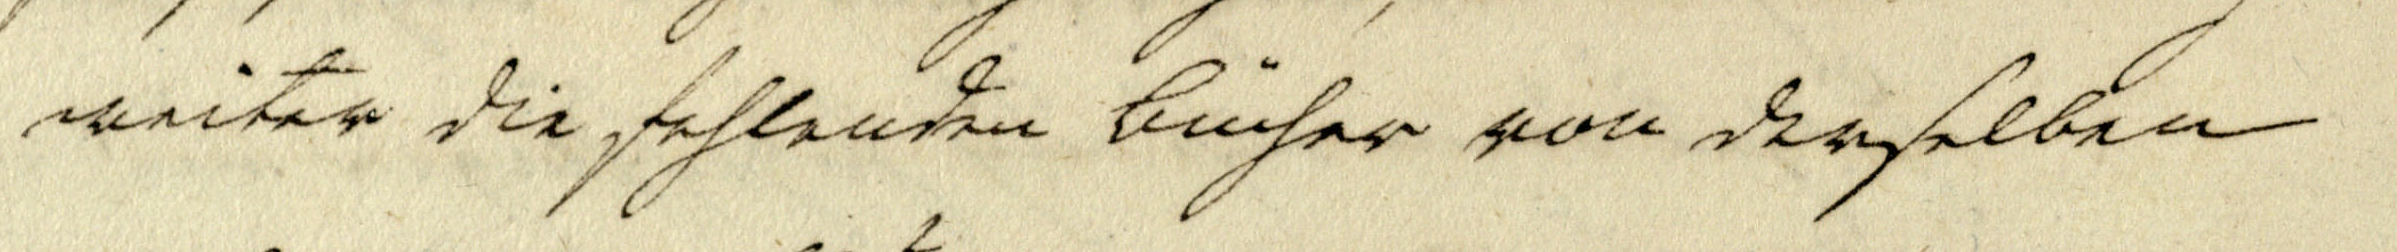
weiter die fehlenden Bücher von derselben
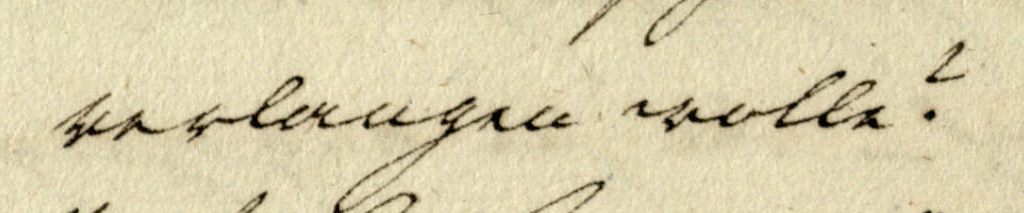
verlangen wolle ?
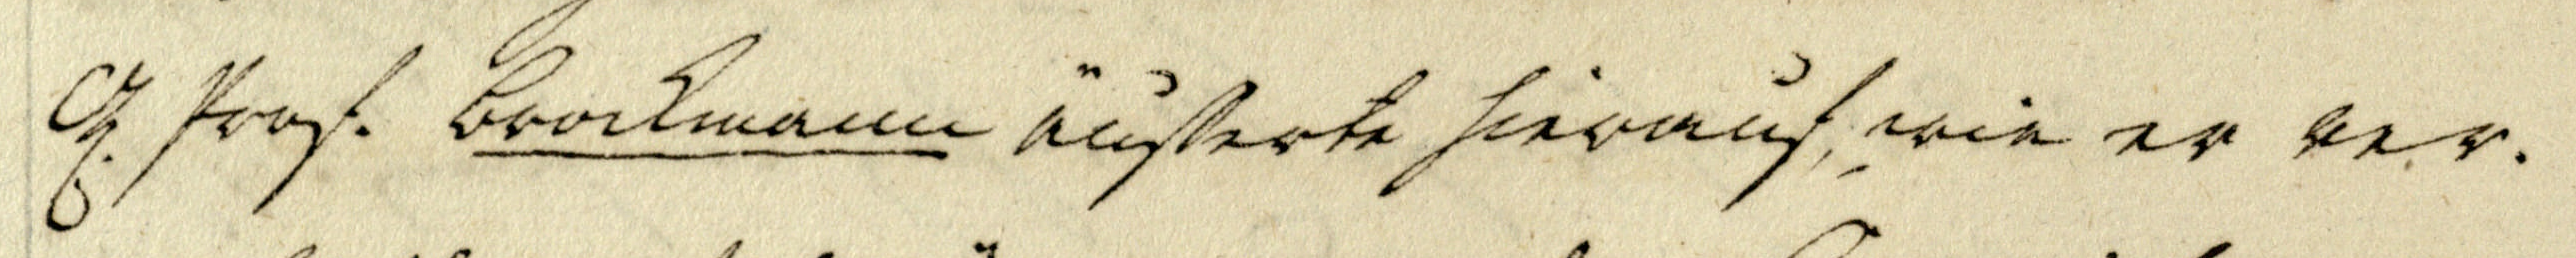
dh. Prof. Brockmann äusserte hierauf, wie er ver¬
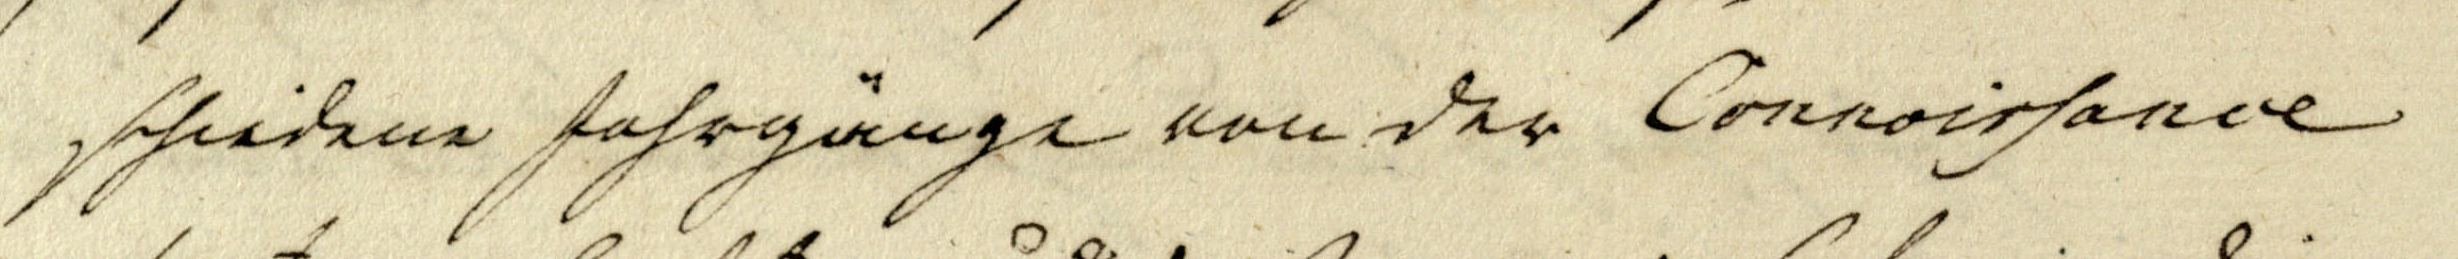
schiedene Jahrgänge von der Connoissance
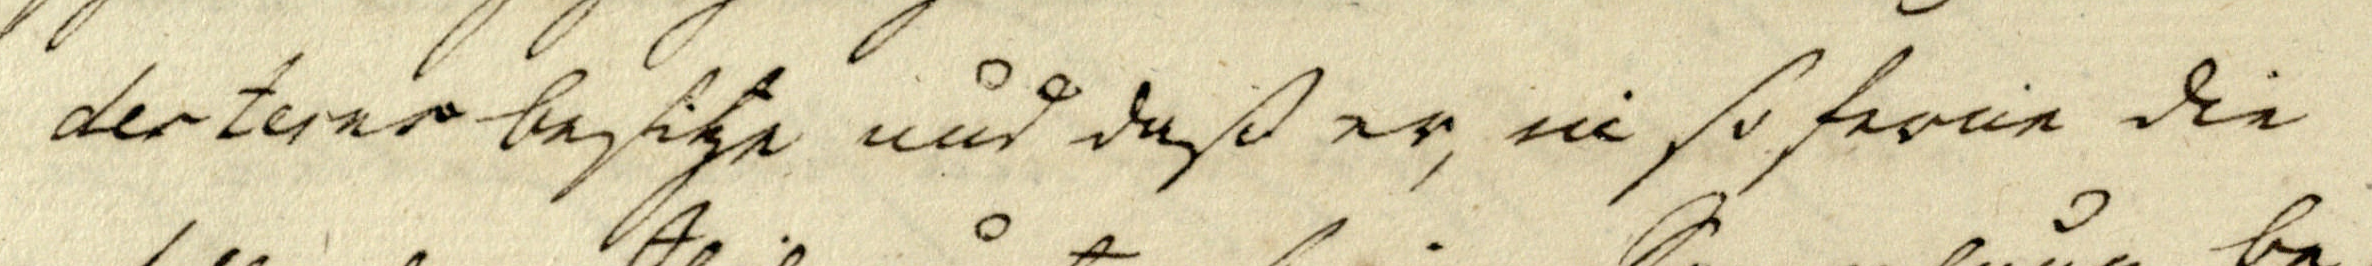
des tems besitze und daß er, in so ferne die
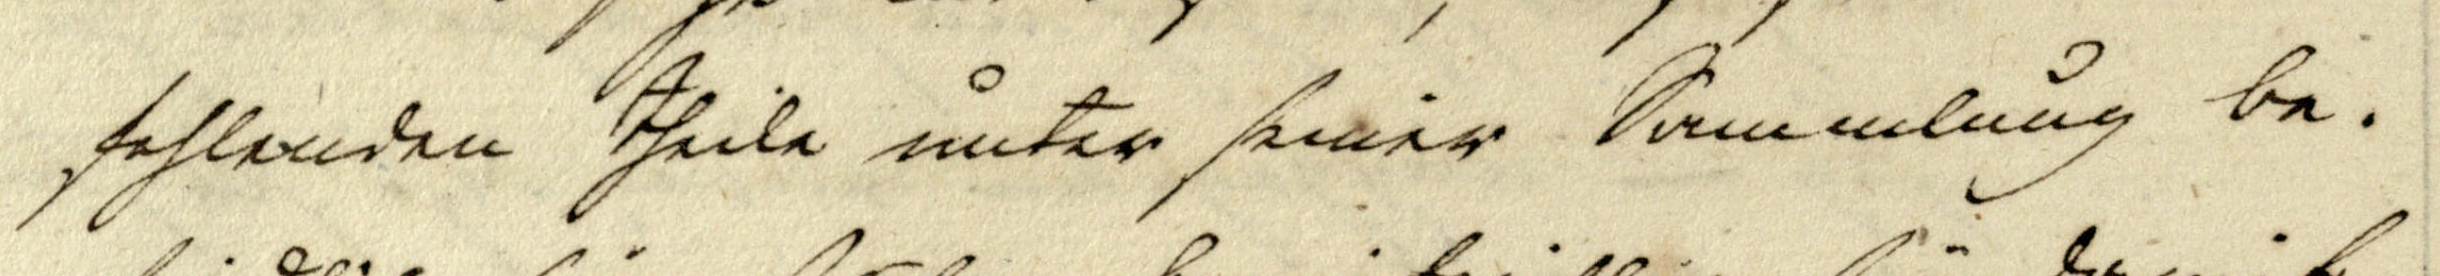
fehlenden Theile unter seiner Sammlung be¬
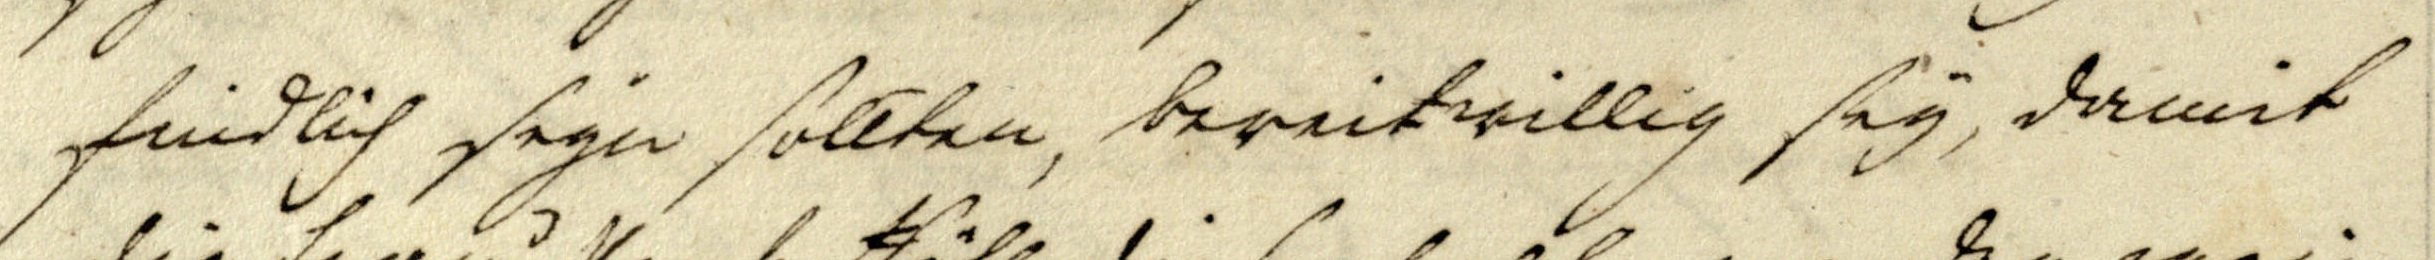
findlich seÿn sollten, bereitwillig seÿ, damit
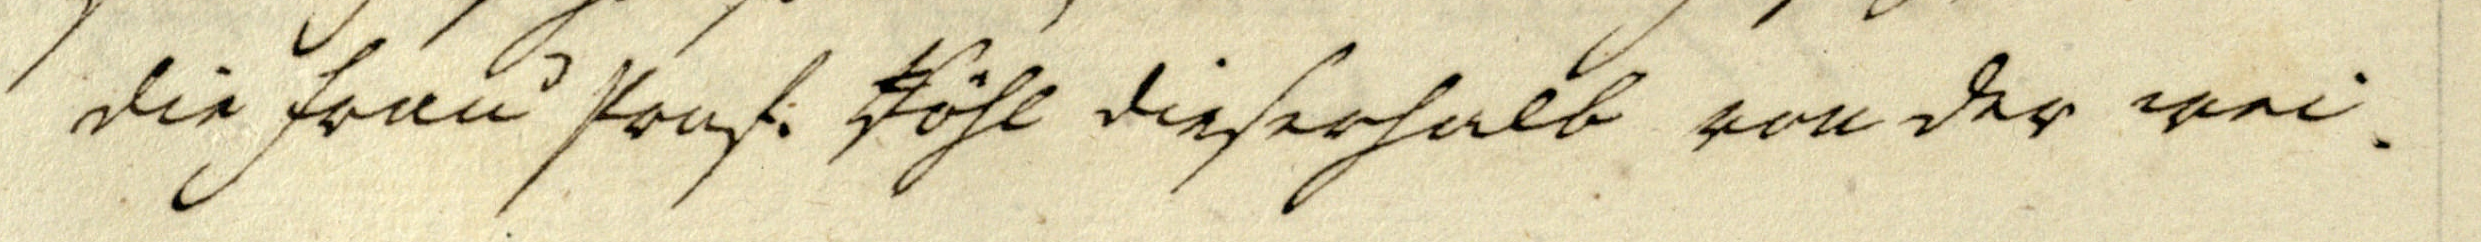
die Frau Prof. Röhl dieserhalb von der wei¬
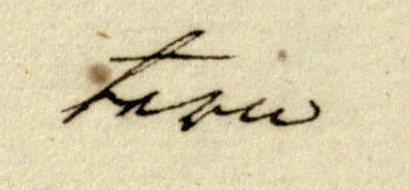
tern
